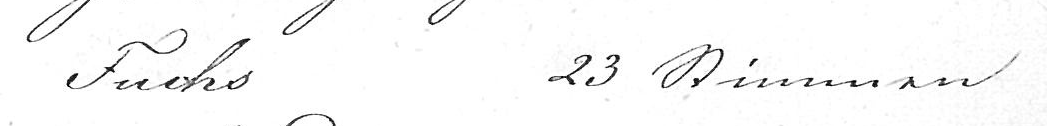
Fuchs 23 Stimmen
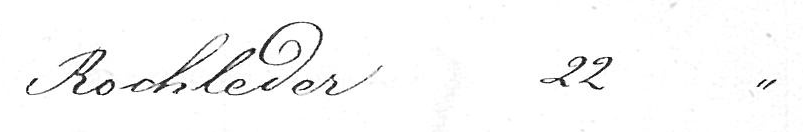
Rochleder 22 "
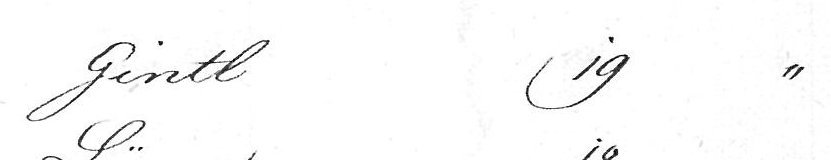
Gintl 19 "
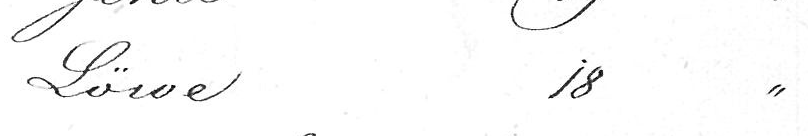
Löwe 18 "
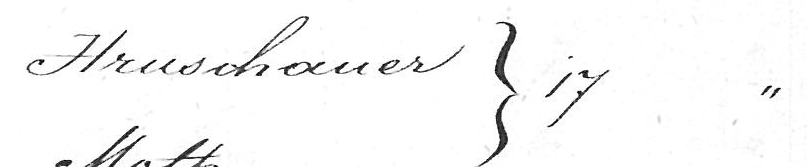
Hruschauer 17 "
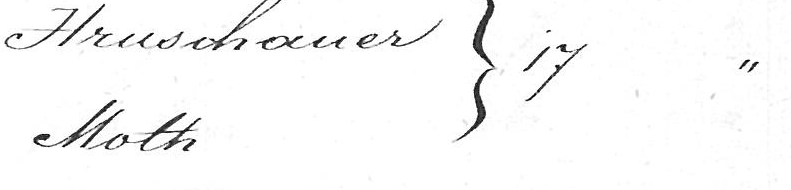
Moth 17 "
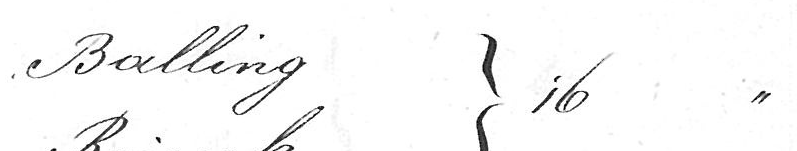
Balling 16 "
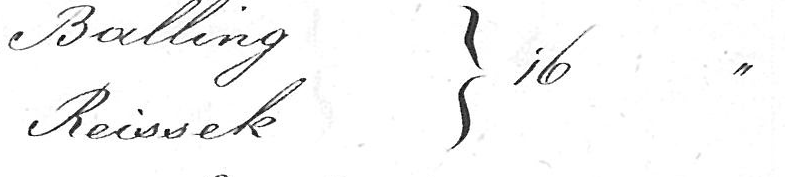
Reissek 16 "
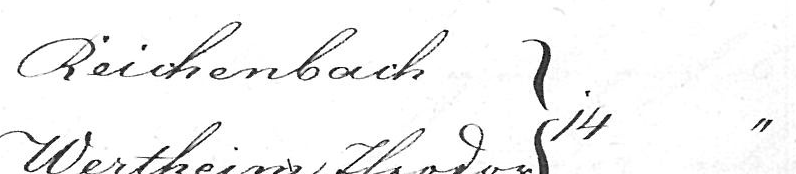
Reichenbach 14 "
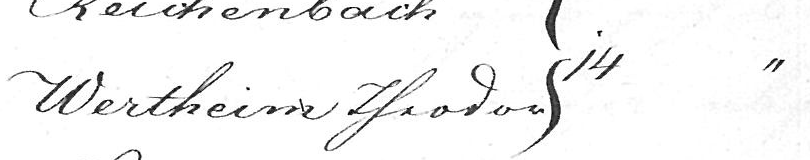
Wertheim Theodor 14 "
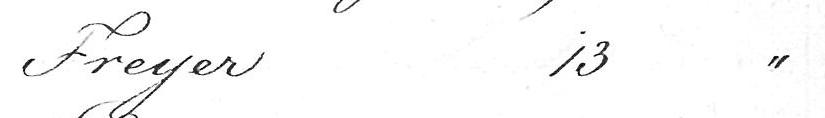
Freyer 13 "
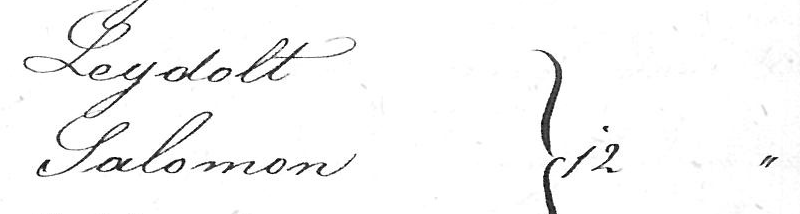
Leydolt 12 "
